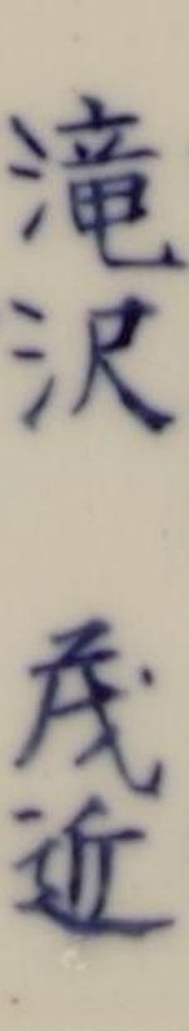滝沢茂近
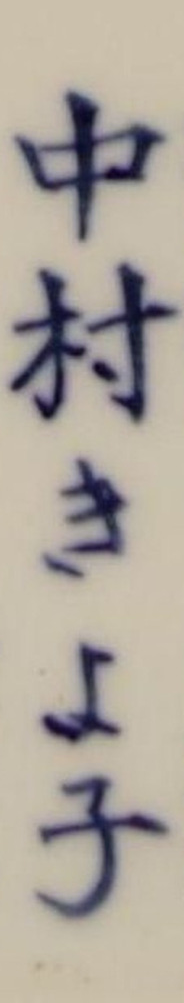中村きよ子
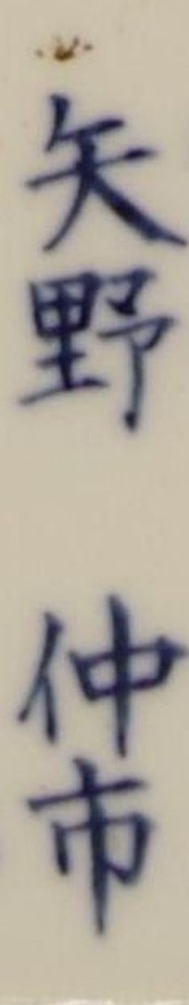矢野仲市
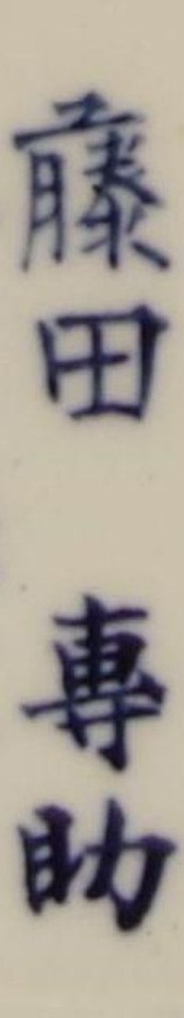藤田専助
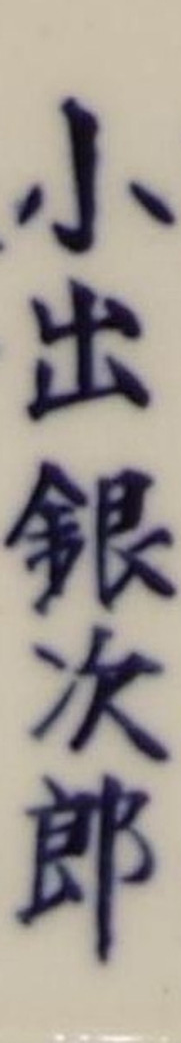小出銀次郎
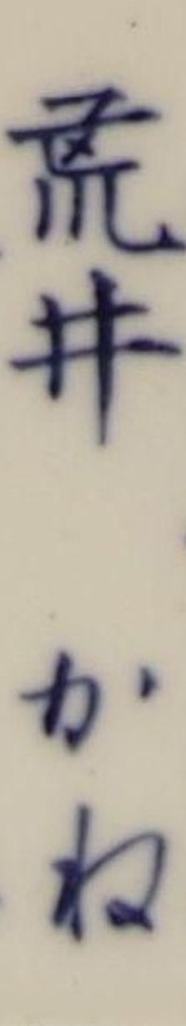荒井かね
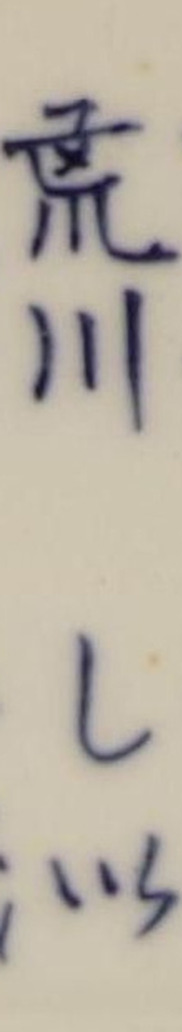荒川しい
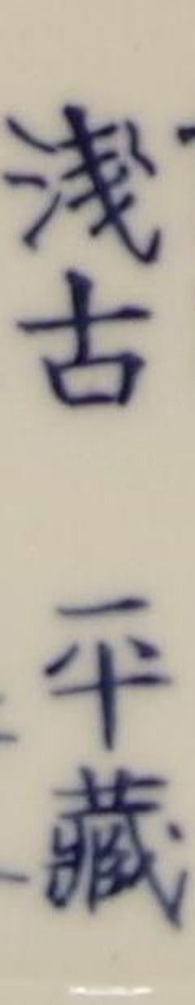浅古平蔵
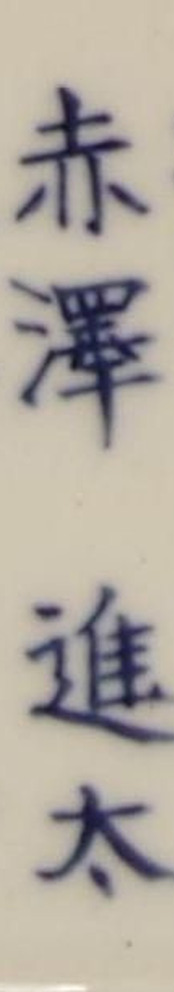赤澤進太
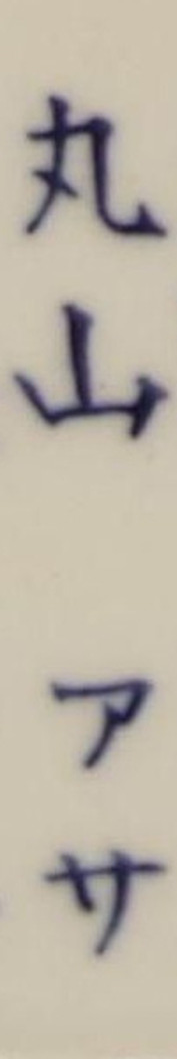丸山アサ
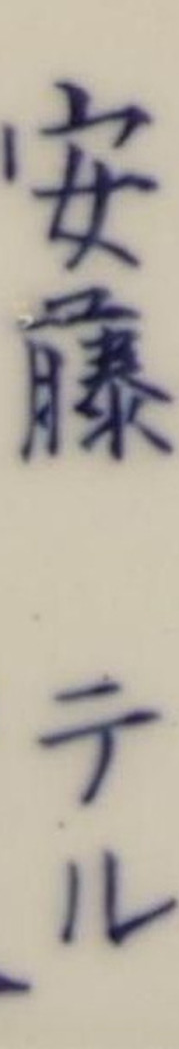安藤テル

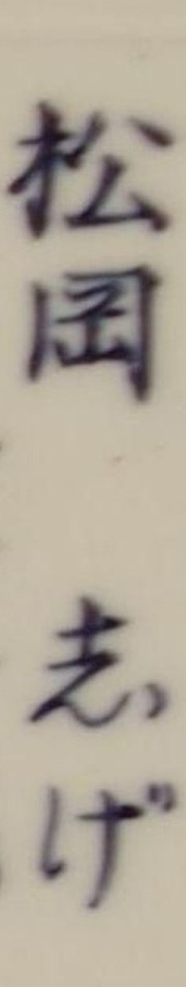松岡しげ
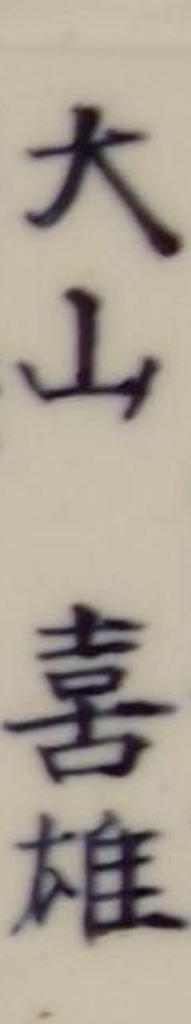大山喜雄
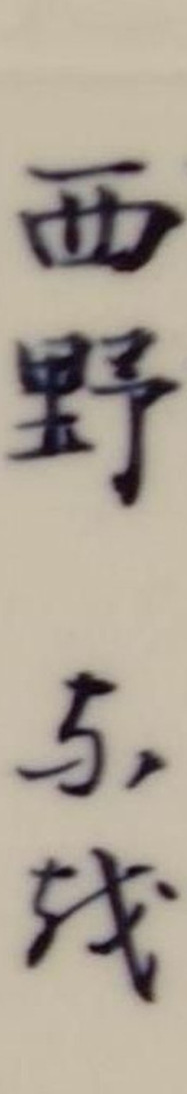西野なを
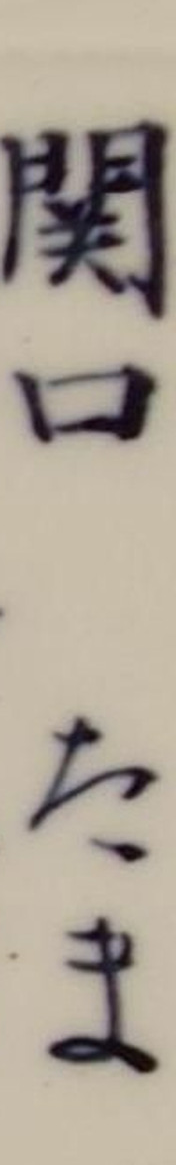関口たま
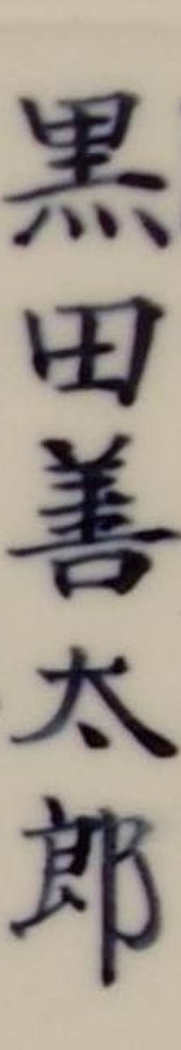黒田善太郎
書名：E~L
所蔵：高野山金剛峯寺
